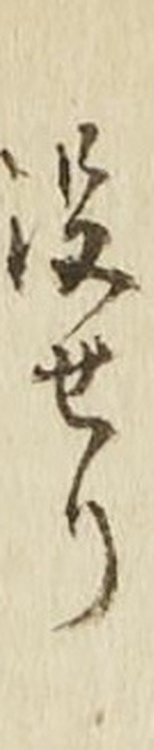没せり
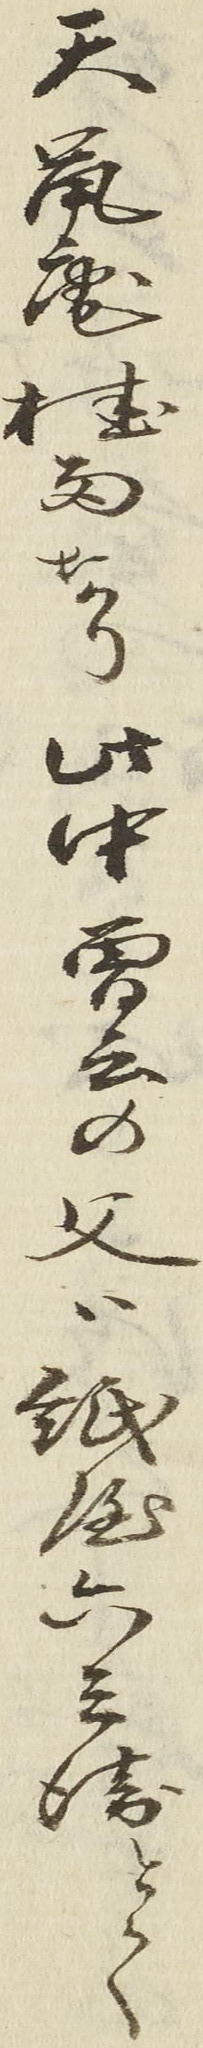天鼠庵桂雨なり此中曽云の父は紙屋六兵衛とて
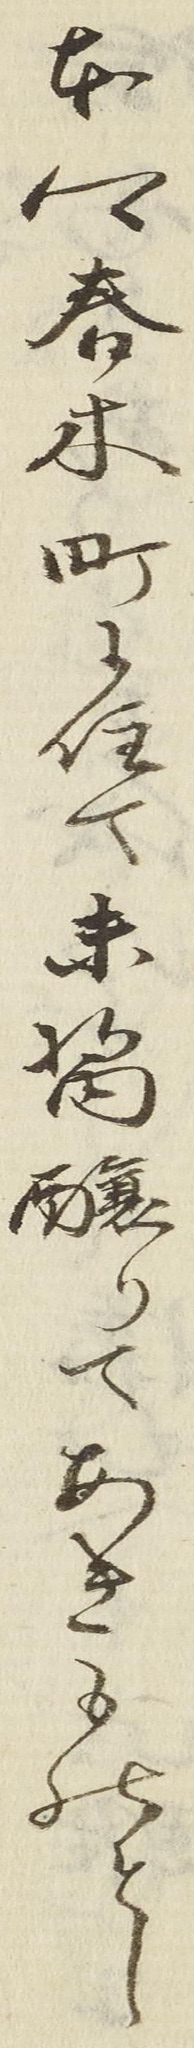本郷春木町に住て未醤醸りてあきものとし
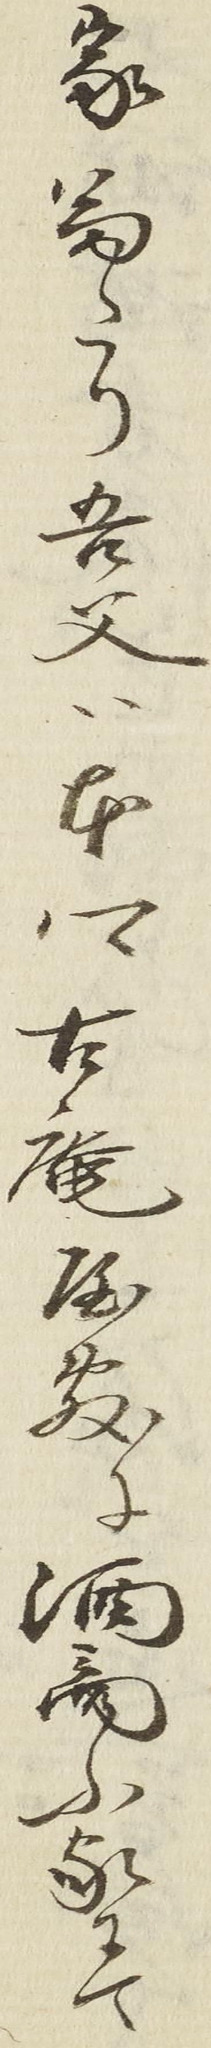家富たり吾父は本郷古庵屋敷に酒商ふ家にて
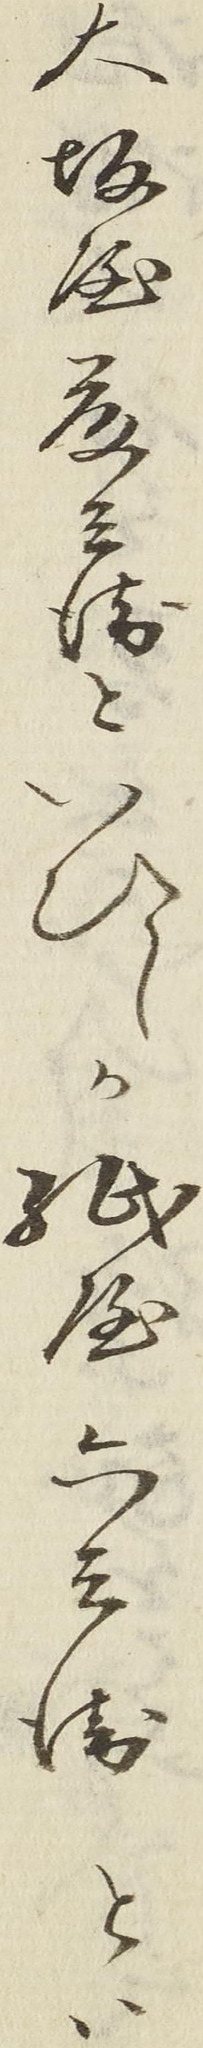大坂屋藤兵衛といひしか紙屋六兵衛とは
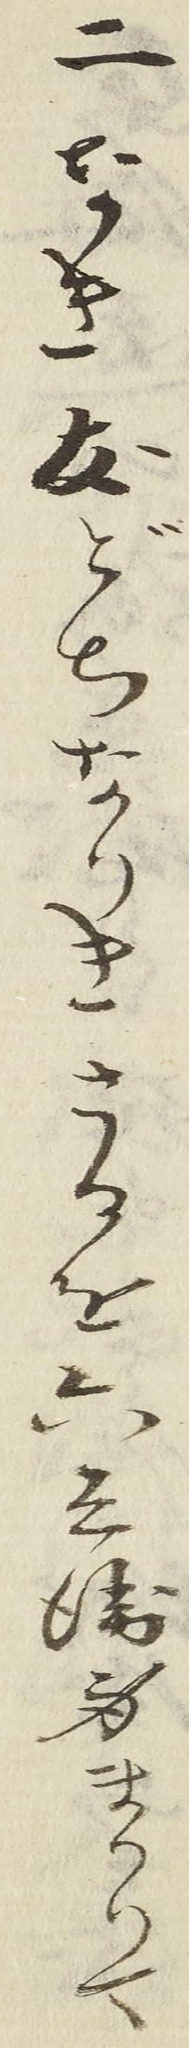二なき友どちなりきさるを六兵衛身まかりて
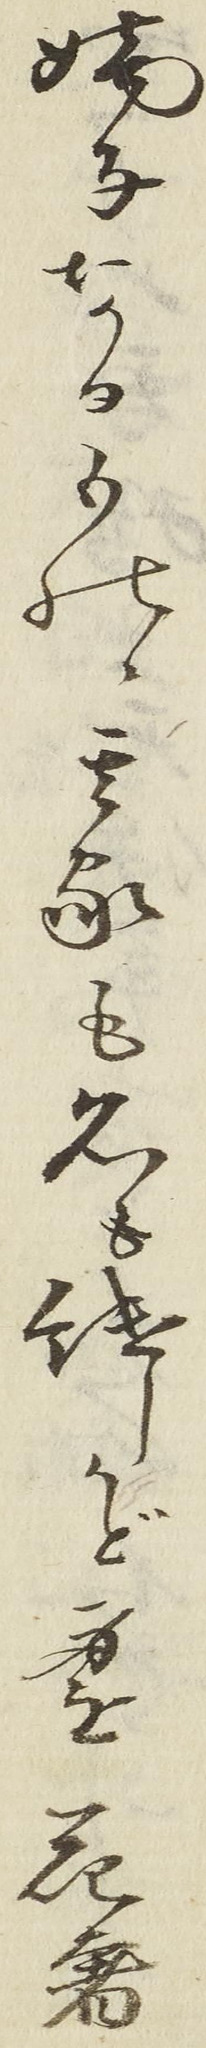嫡子なるものゝ其家も名も継しかど身を花奢
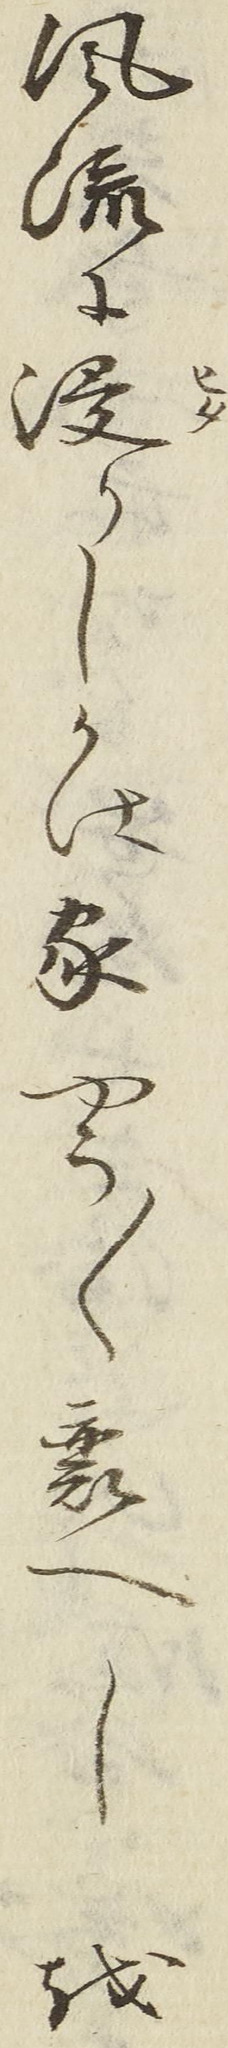風流に浸りしかは家やう〳〵衰へしを
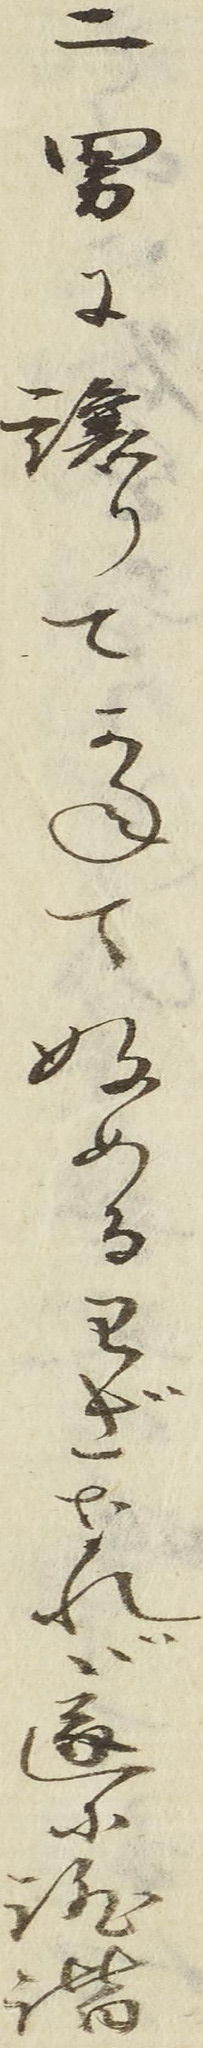二男に譲りてかねて好めるわざなれば遂に誹諧

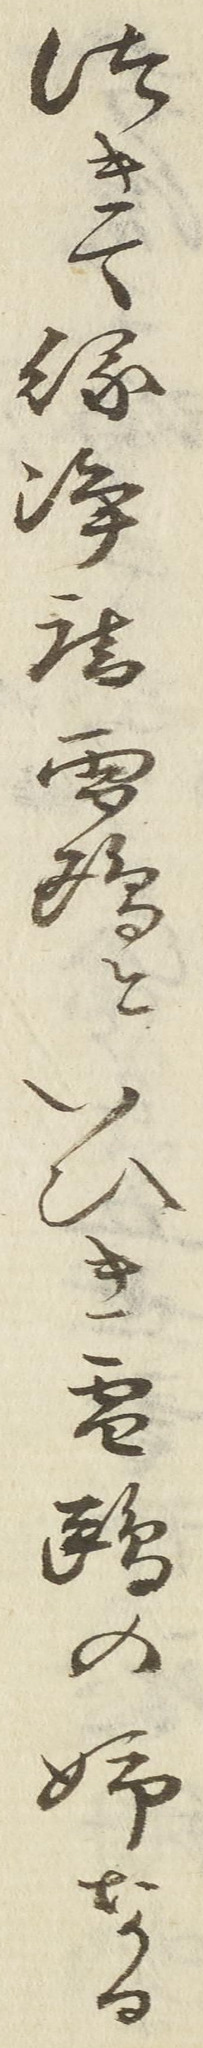つきて縁浄庵雪鴎といひき雪鴎の姉なる
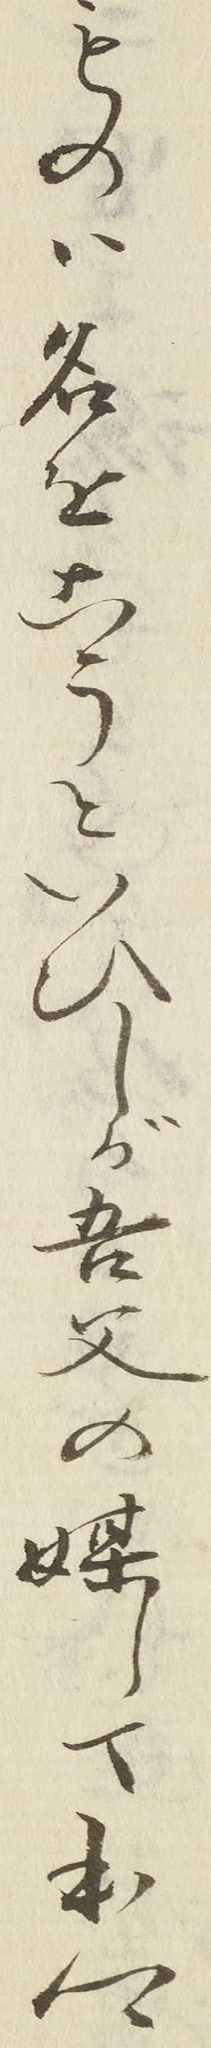ものは名をこうといひしが吾父の媒して本郷
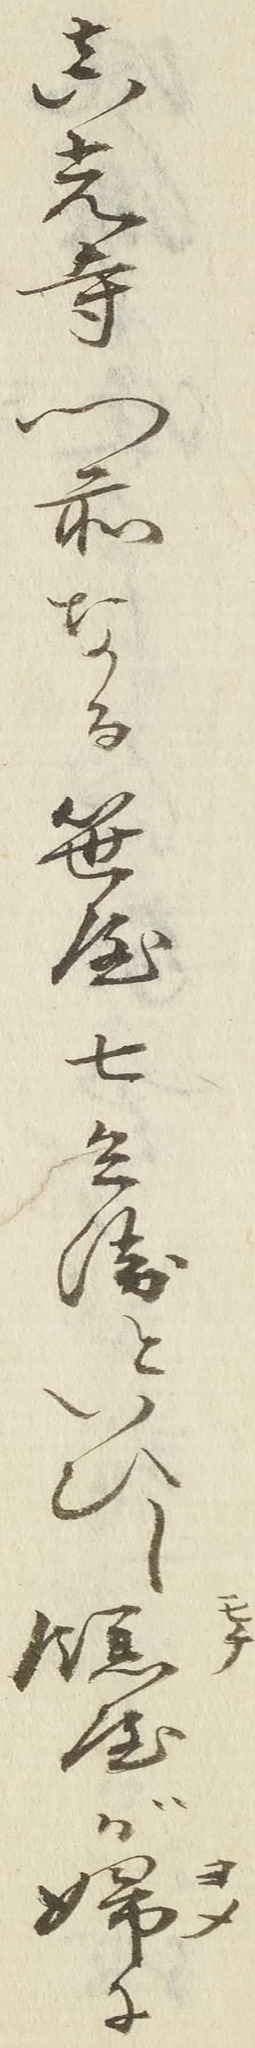真光寺門前なる笹屋七兵衛といひし餅屋が婦に
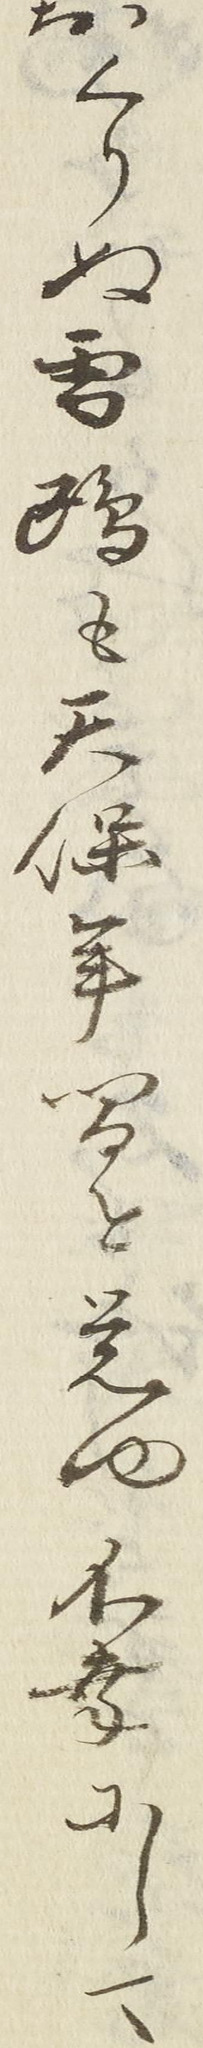おくりぬ雪鴎も天保年間と覚ゆ不幸にして
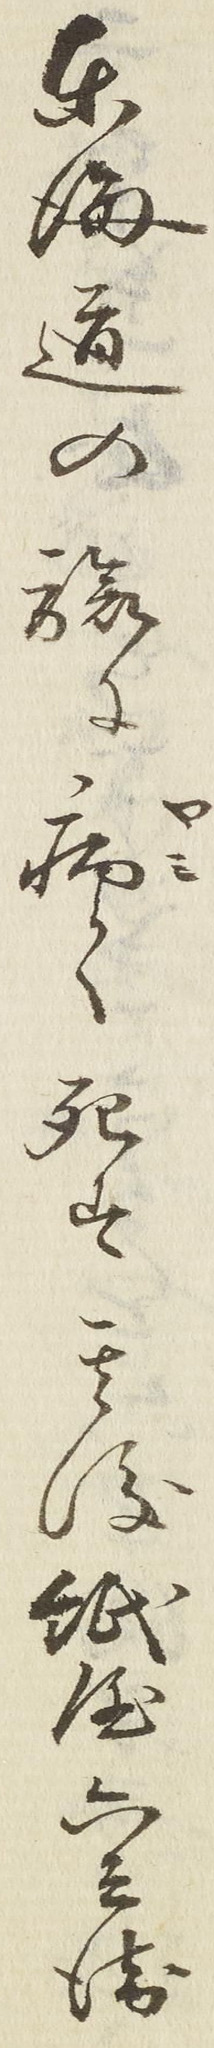東海道の旅に病て死す其後紙屋六兵衛
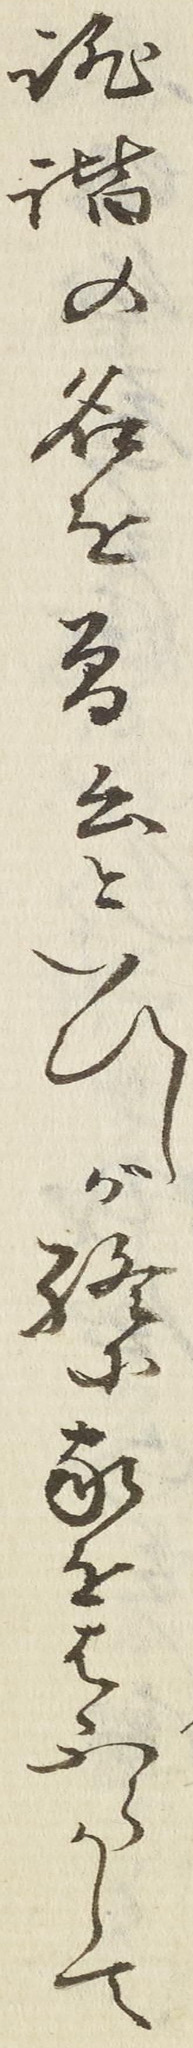誹諧の名を曽云といひしか終に家をはふ屠らかして
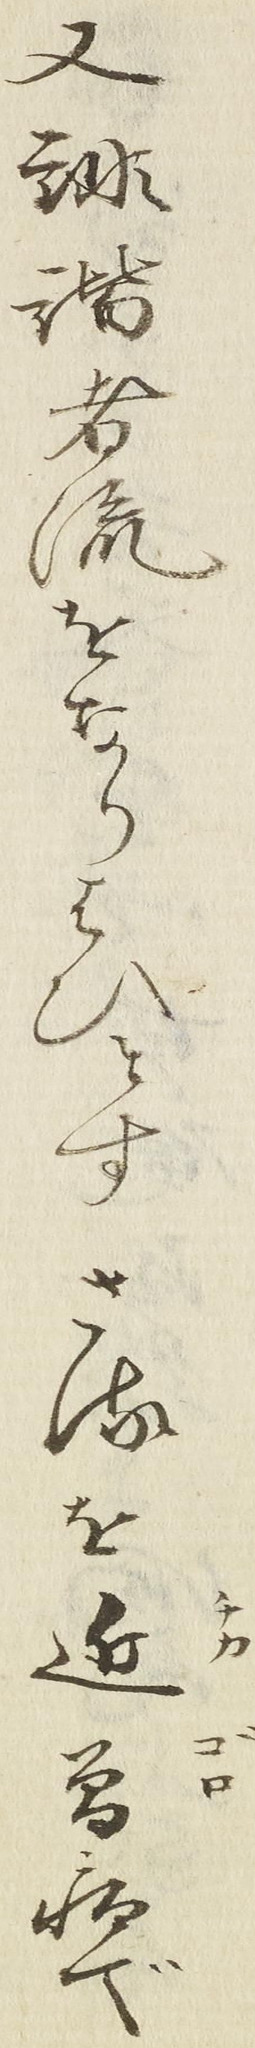又誹諧者流をなりはひとすさるを近曽病で
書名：やぶれ窓の記　全
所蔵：東京大学地震研究所図書室 Earthquake Research Institute Library, The University of Tokyo, JAPAN
